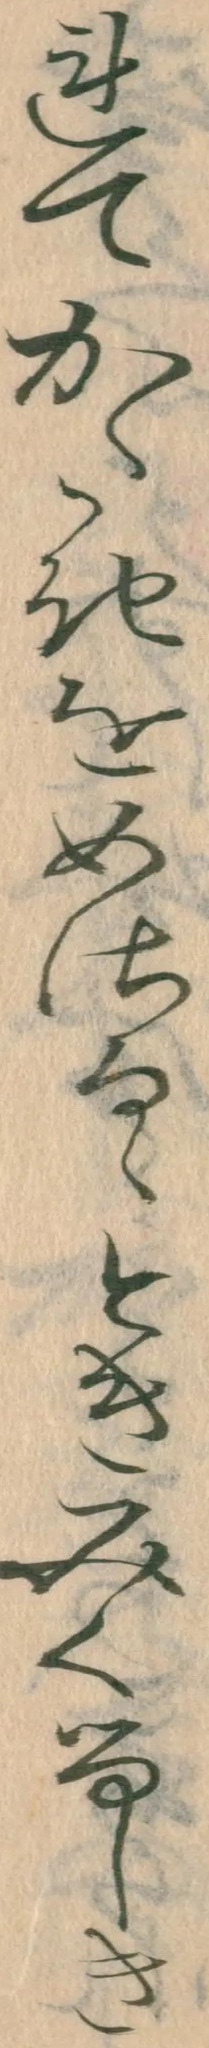れてかたきをめさるゝときみくるしき
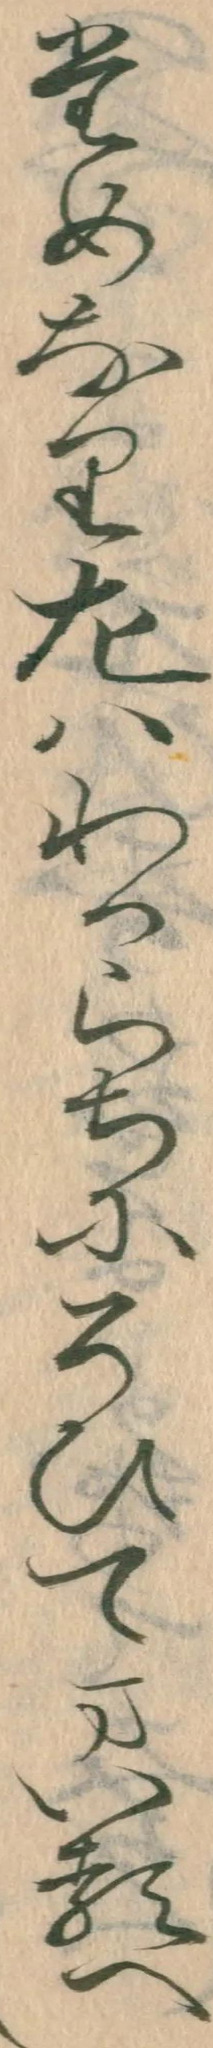ためなり左はわからちにそひてまいるへし
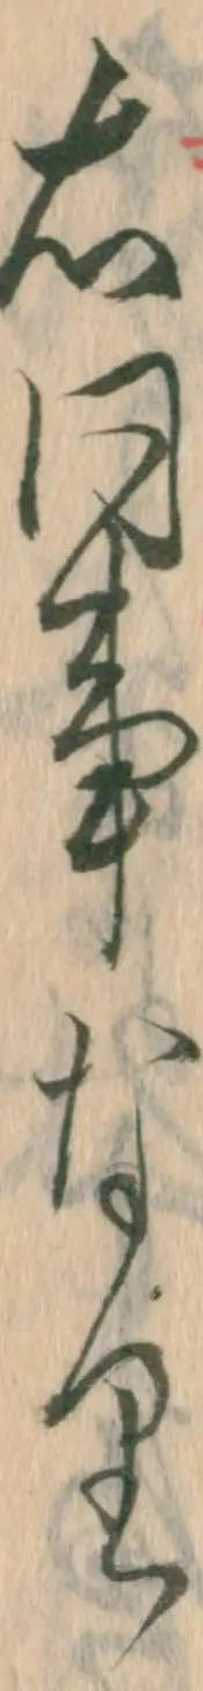右同事なり
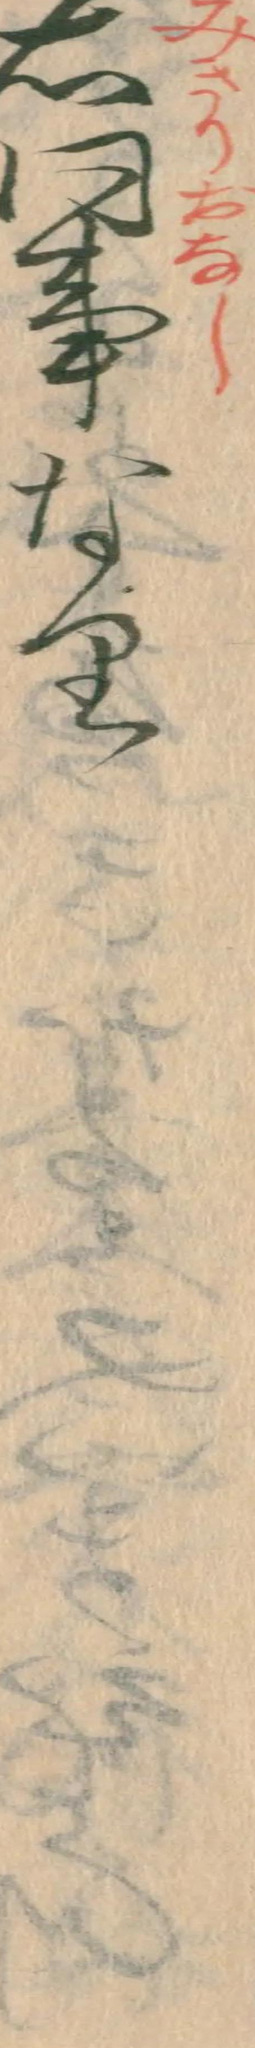右同事なり
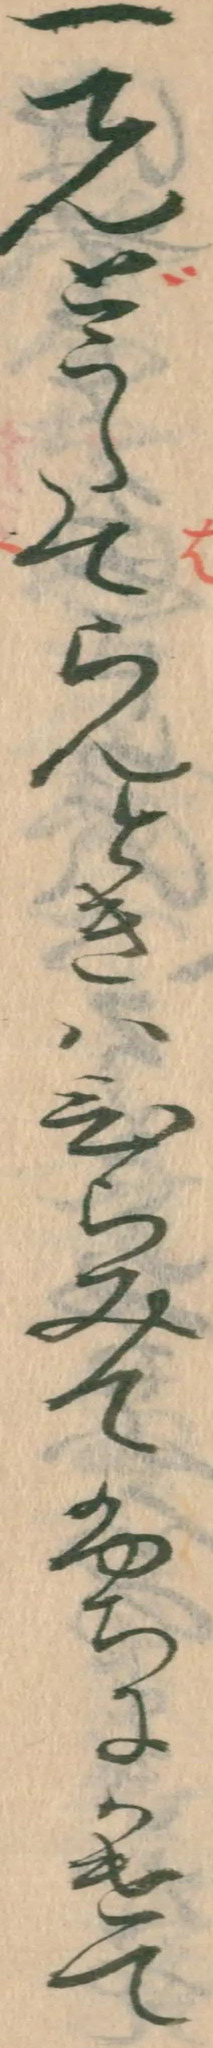一てんどうたてらんときはひらみてふちにかけて
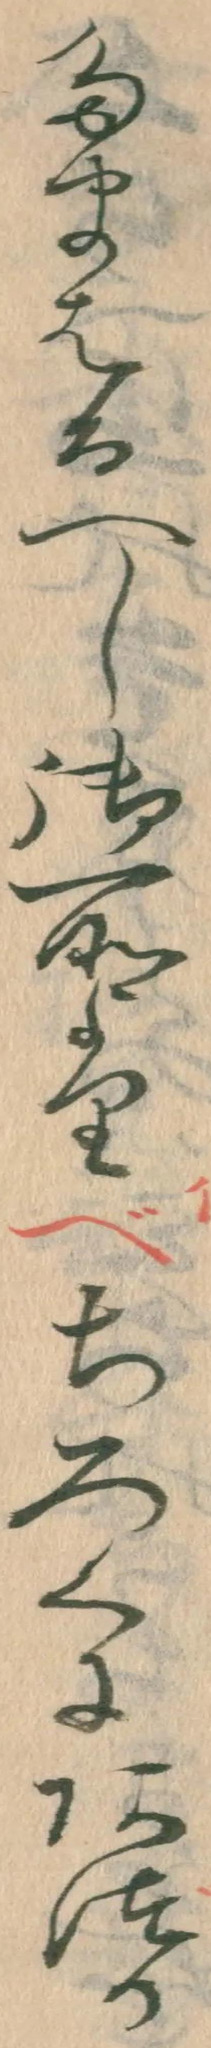たまはるへし御所よりべちろくにあづか
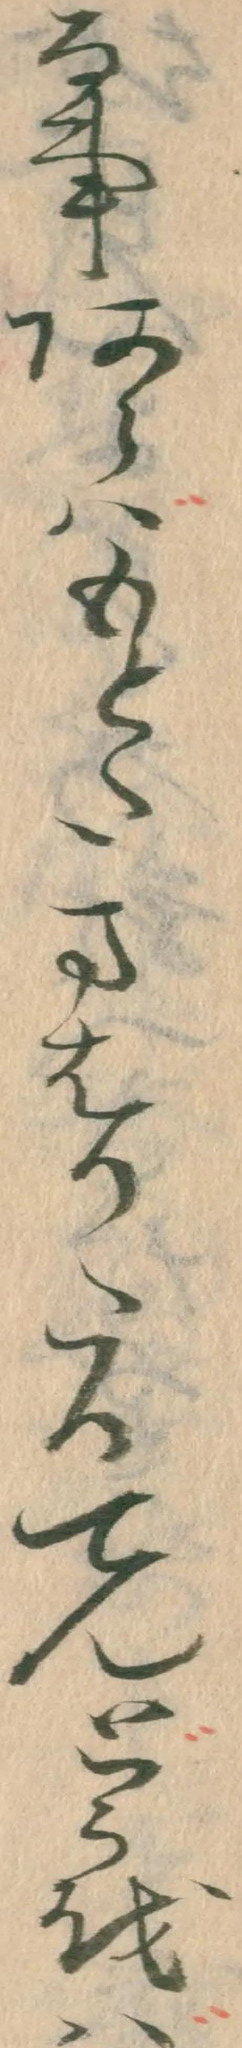る事あらはもとたまはりたるてんどうをば
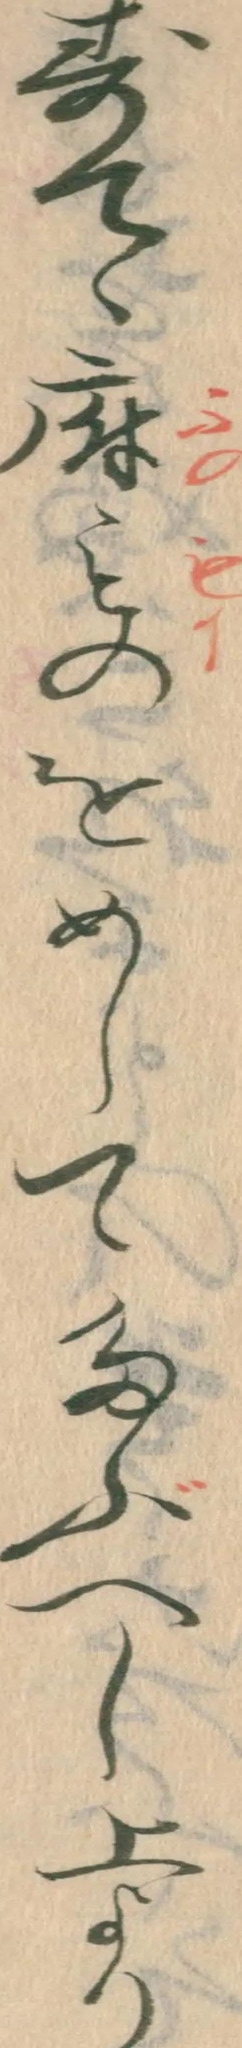すてゝ府ものをめしてたぶへし上より
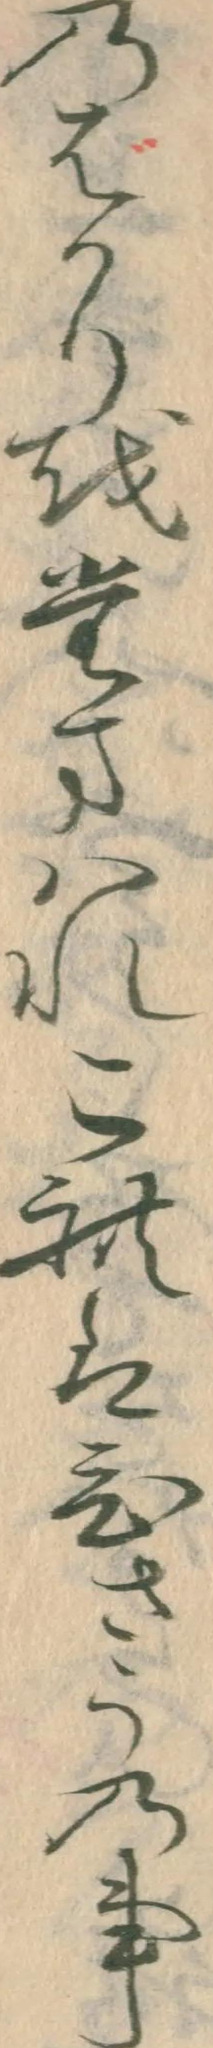のばかりをたまはれこれはひさうの事
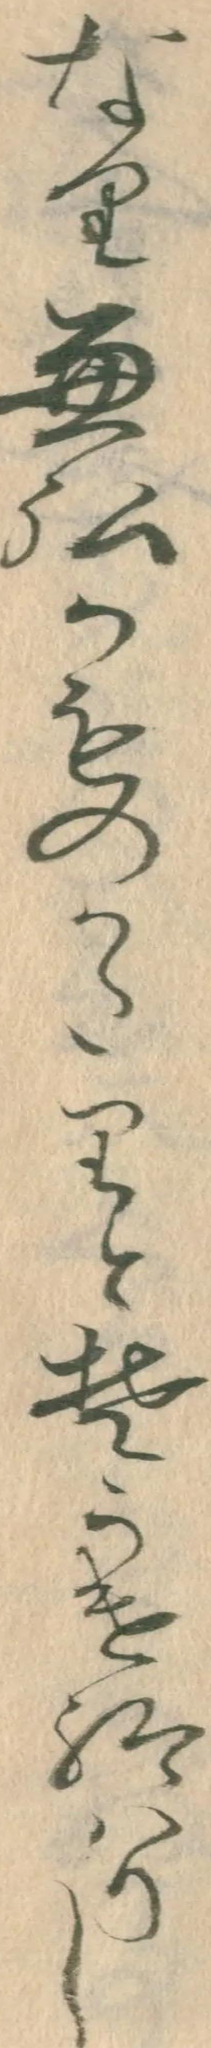なり兼弘かものかたりとそうけ給はりし
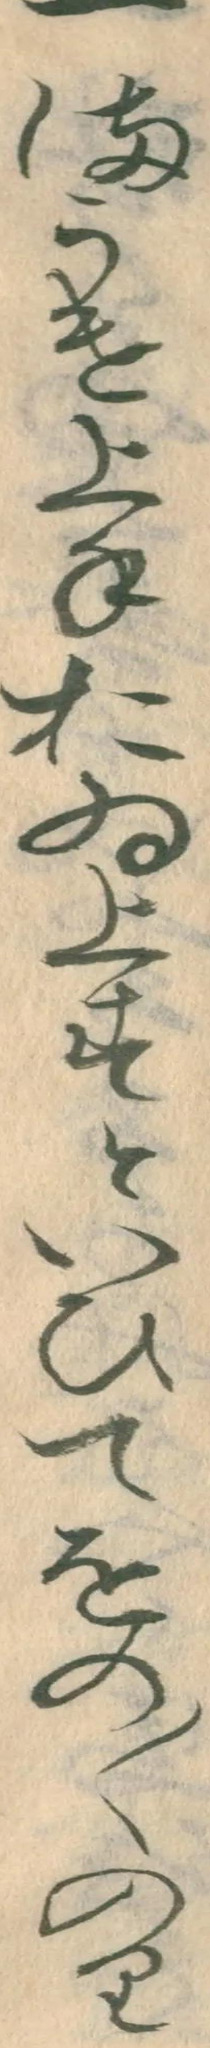一まうけ上手おゐ上すといひてをの〳〵のり
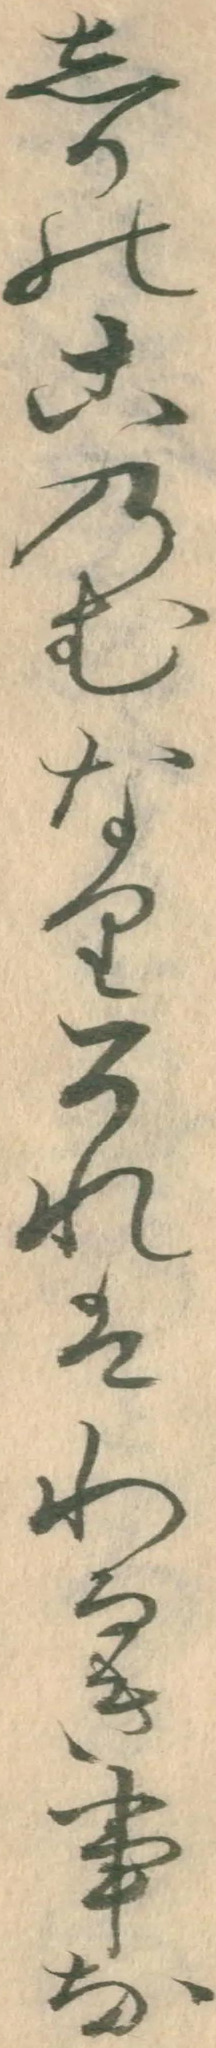しりのこのむなりそれはわるき事な
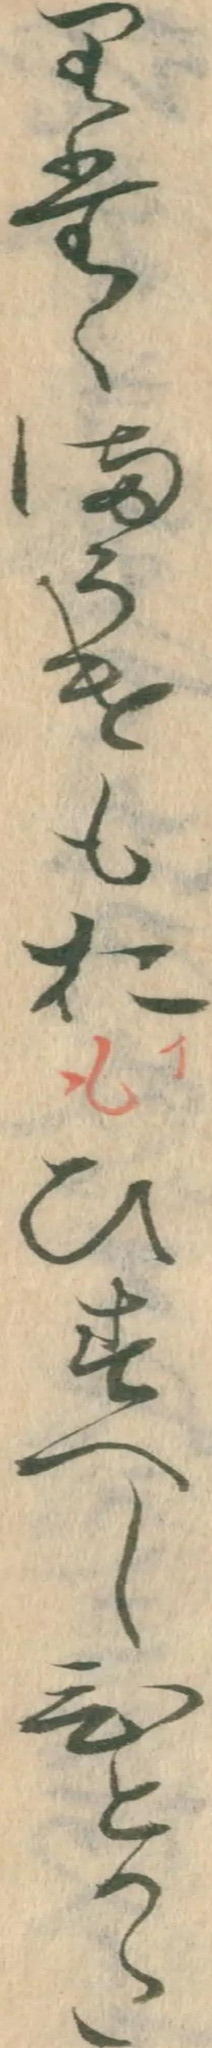りたゝまうけもおもひすへしひとかた

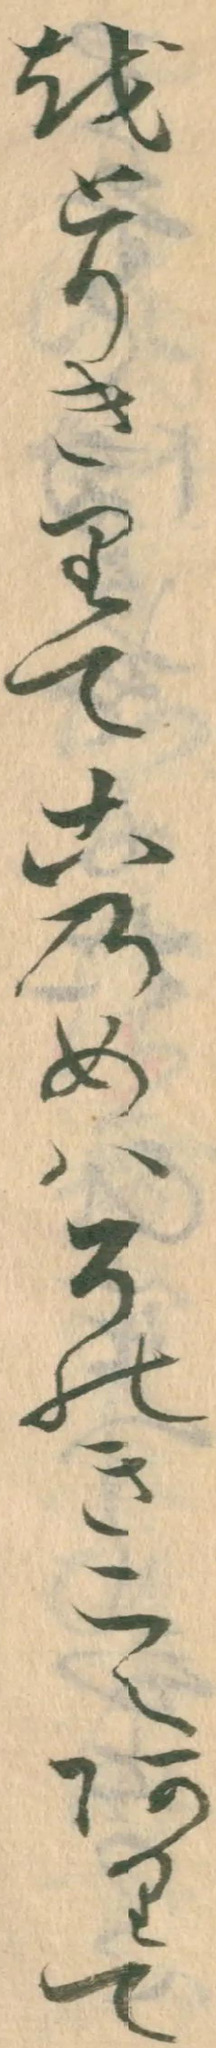をとりきりてこのめはそのきこえありて
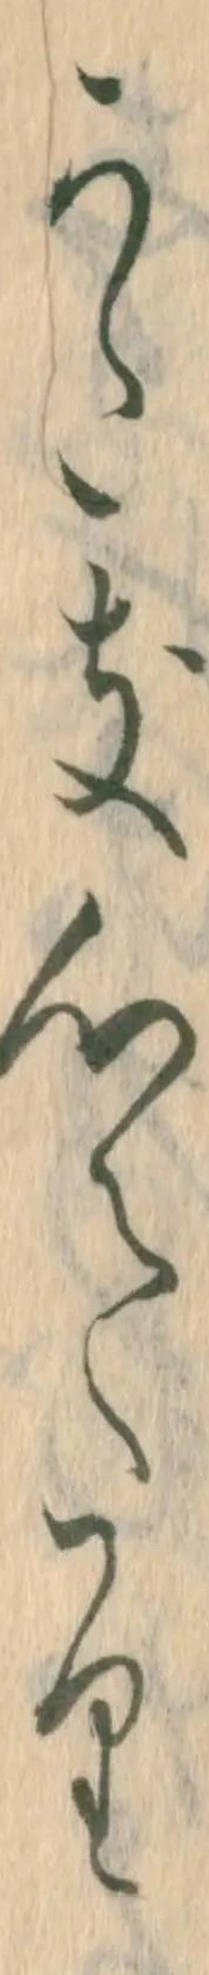かたき心えたり
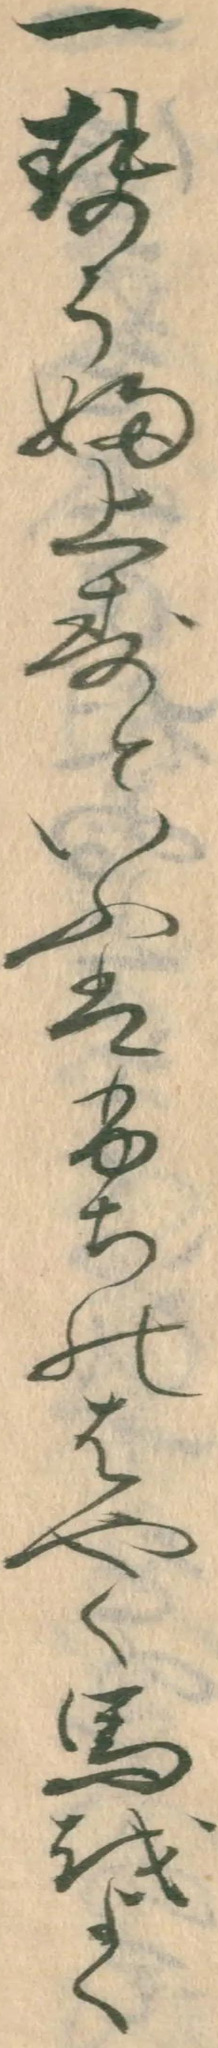一せうふ上すといふはふちのはやく馬をよく
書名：賀茂社記録. 第13冊
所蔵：国立国会図書館 National Diet Library, JAPAN
